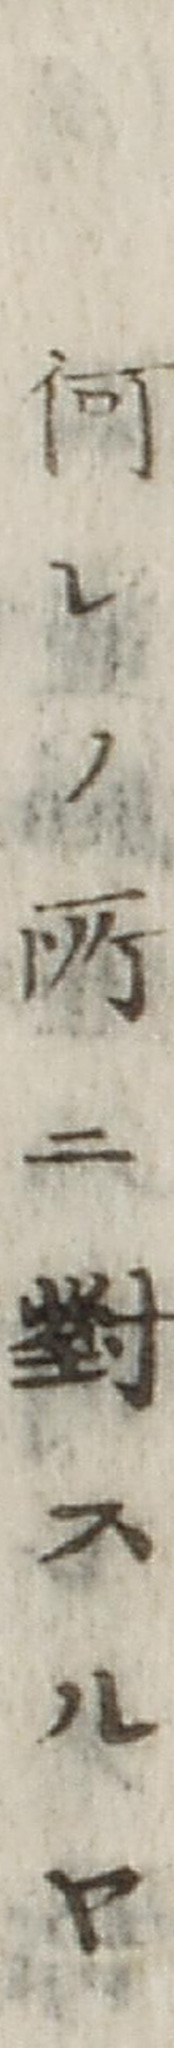何レノ所ニ対スルヤ
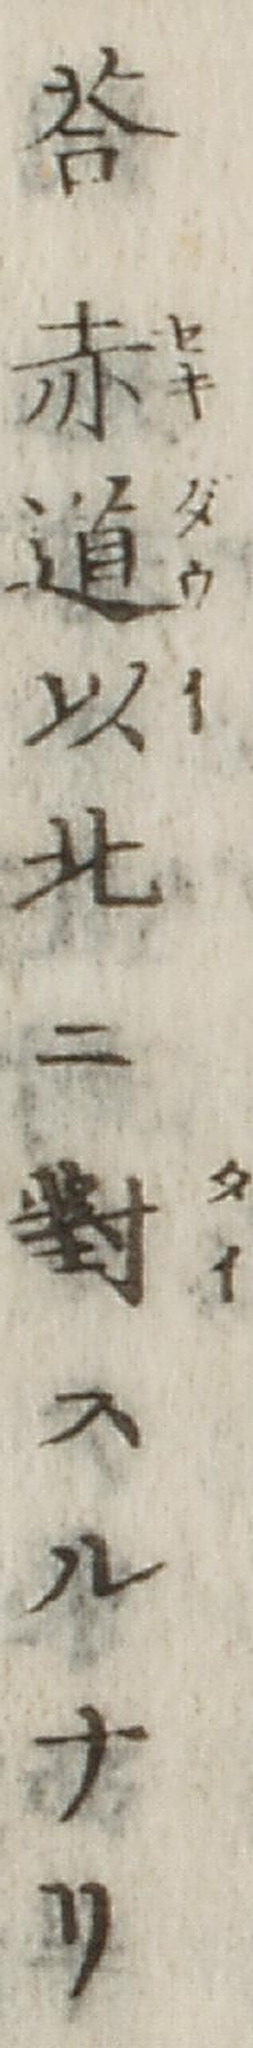答赤道以北ニ対スルナリ
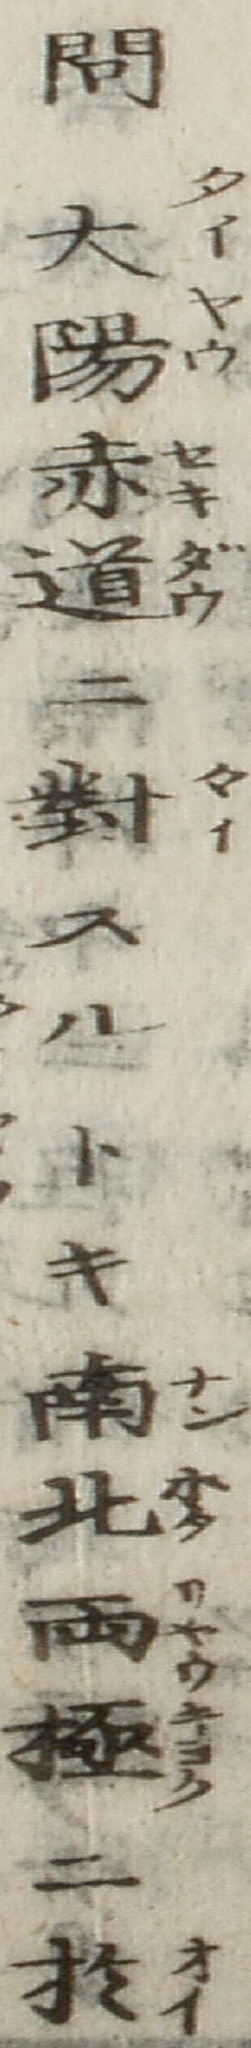問大陽赤道ニ対スルトキ南北両極ニ於
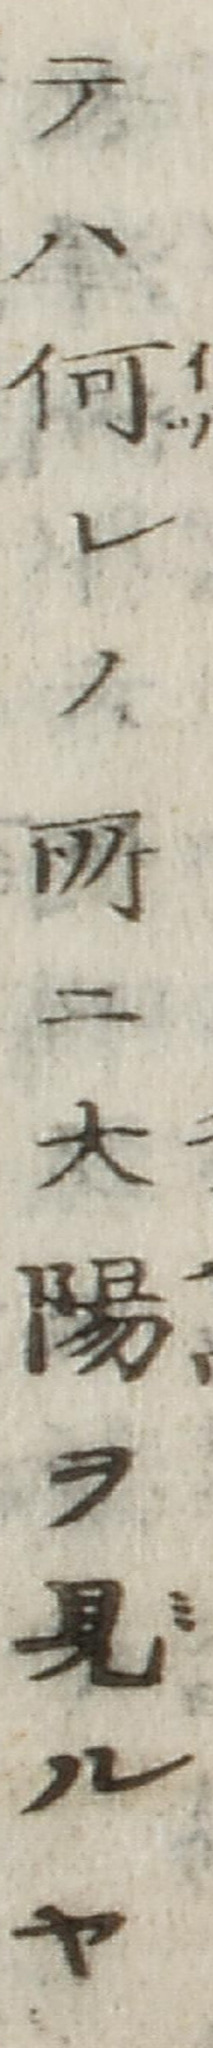テハ何レノ所ニ大陽ヲ見ルヤ
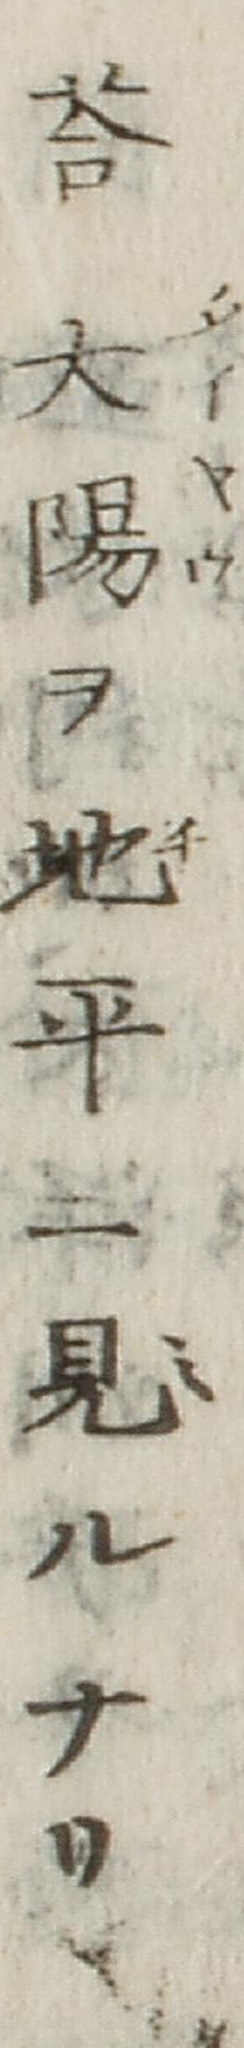答大陽ヲ地平ニ見ルナリ
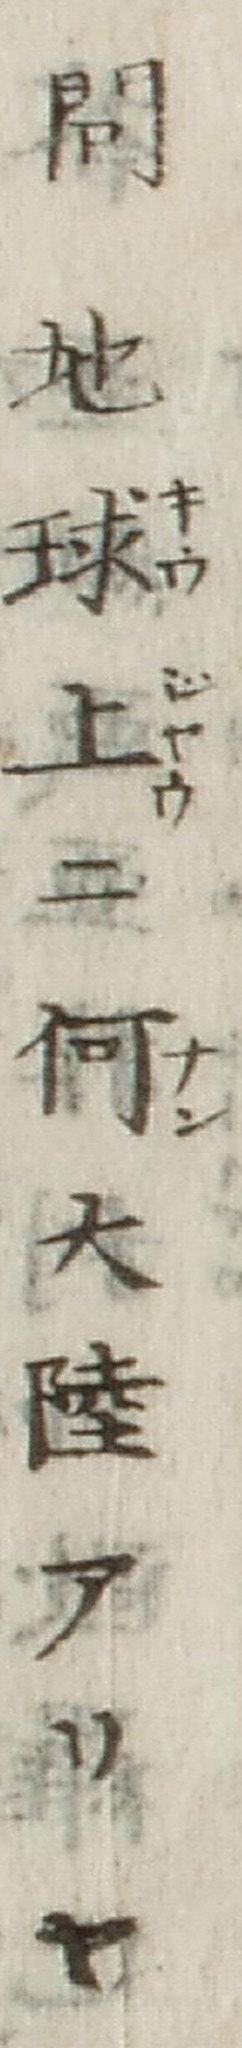問地球上ニ何大陸アリヤ
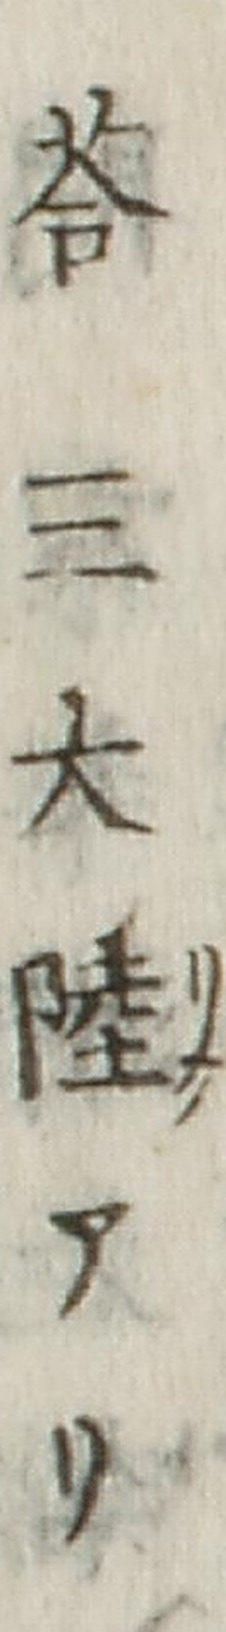答三大陸アリ
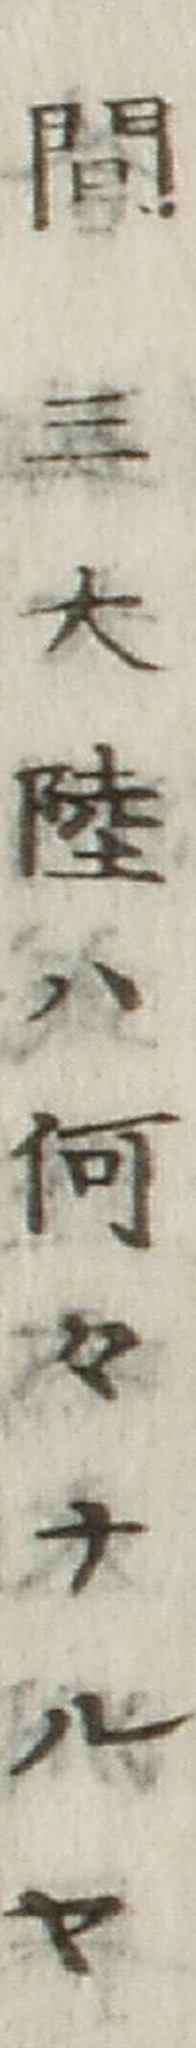問三大陸ハ何々ナルヤ
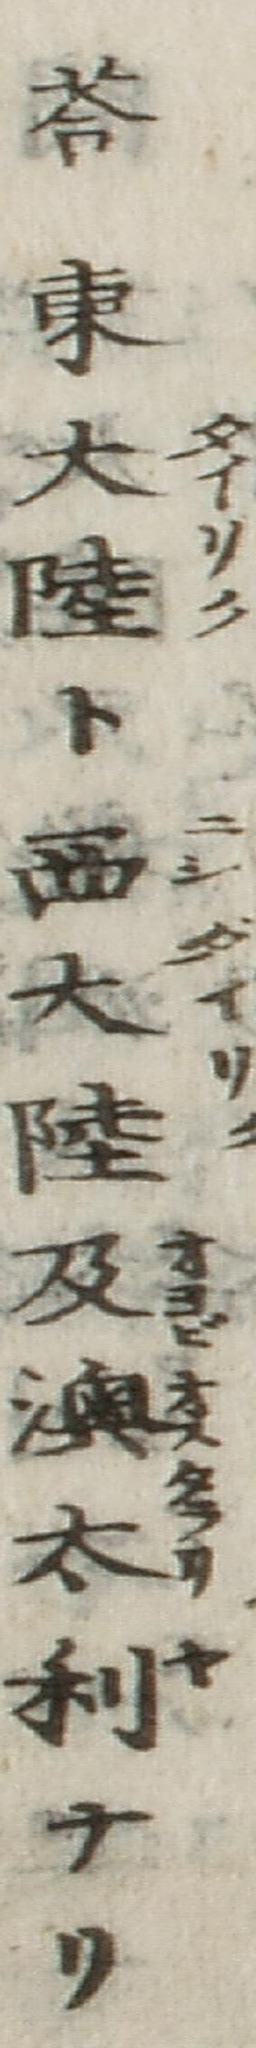答東大陸ト西大陸及澳太利ナリ

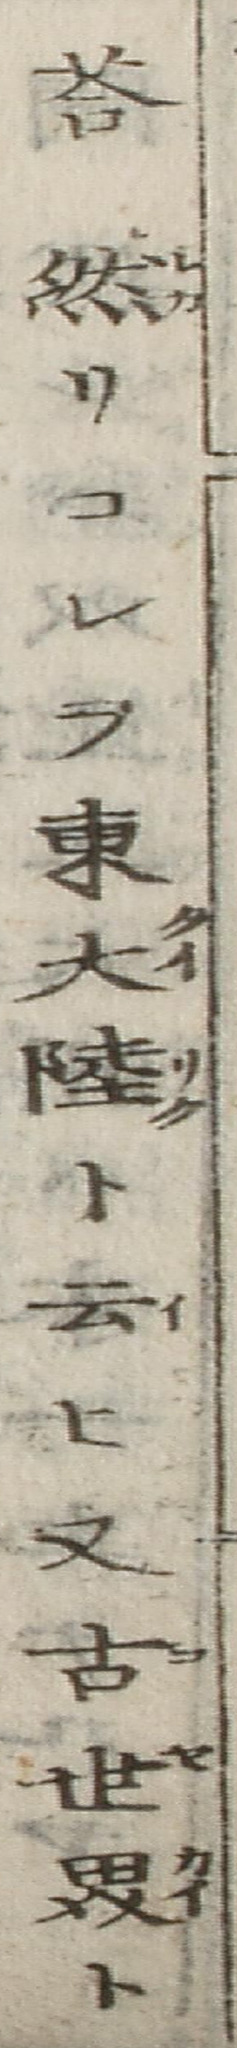答然リコレヲ東大陸ト云ヒ又古世界ト
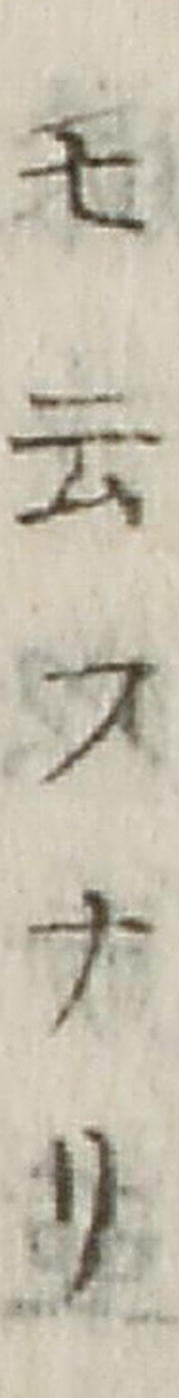モ云フナリ
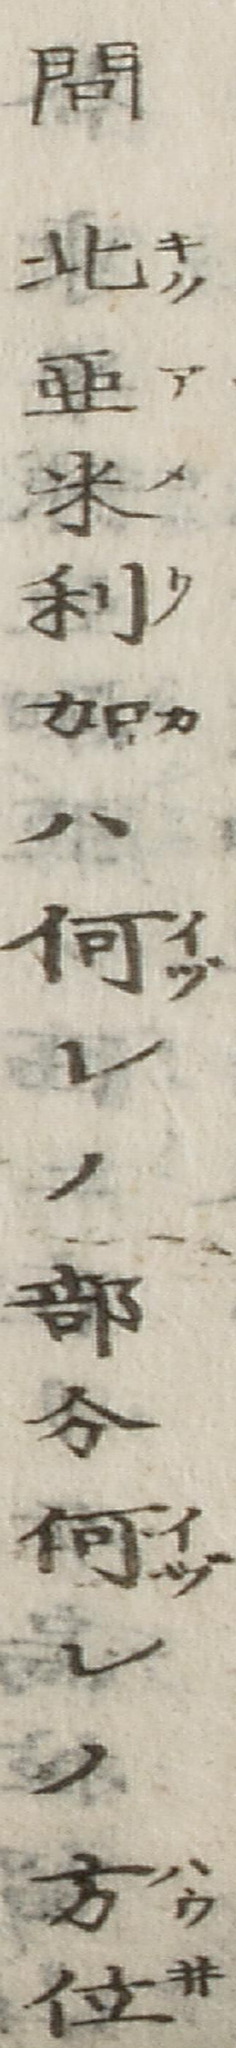問北亜米利加ハ何レノ部分何レノ方位
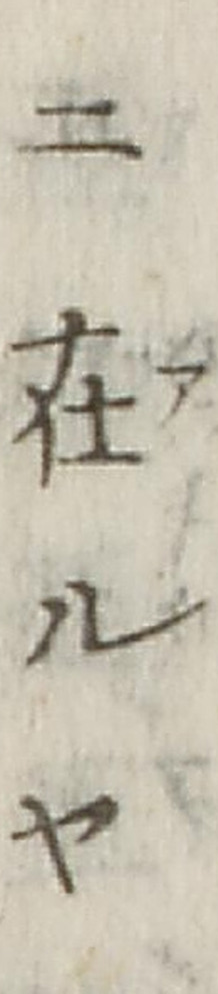二在ルヤ
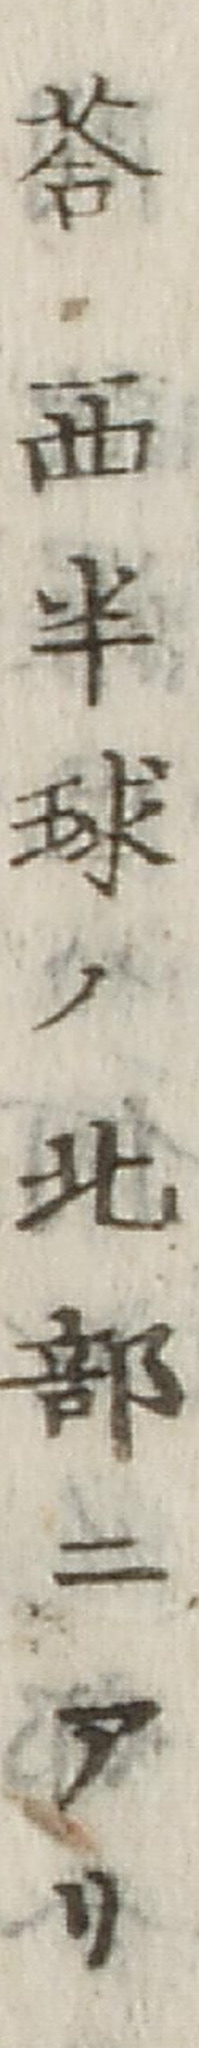答西半球ノ北部二アリ
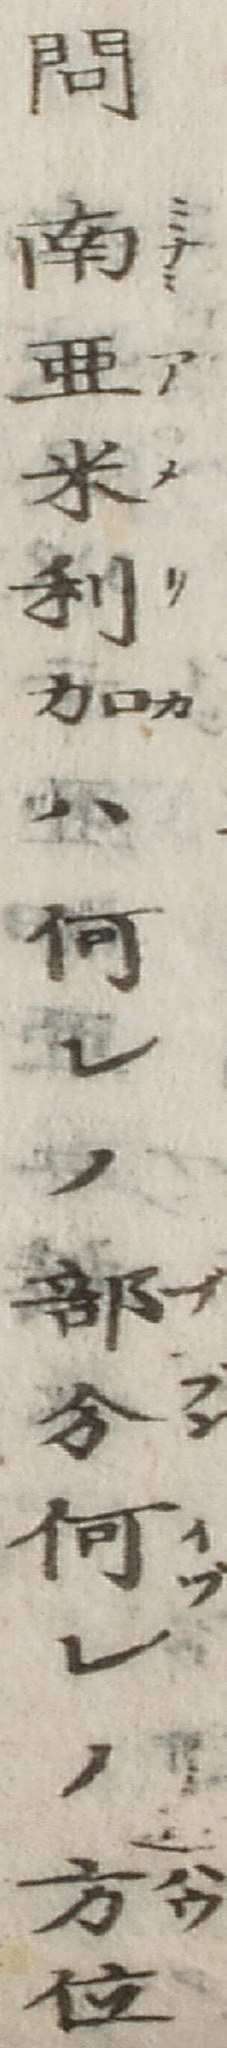問南亜米利加ハ何レノ部分何レノ方位
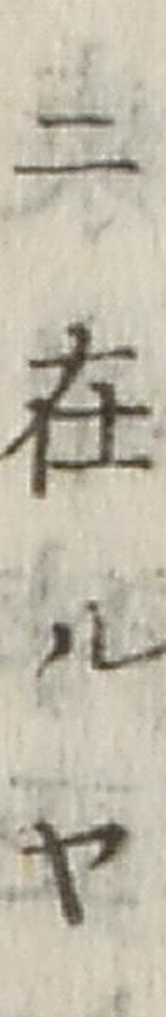二在ルヤ
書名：地球儀問答　全
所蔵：東京大学地震研究所図書室 Earthquake Research Institute Library, The University of Tokyo, JAPAN
